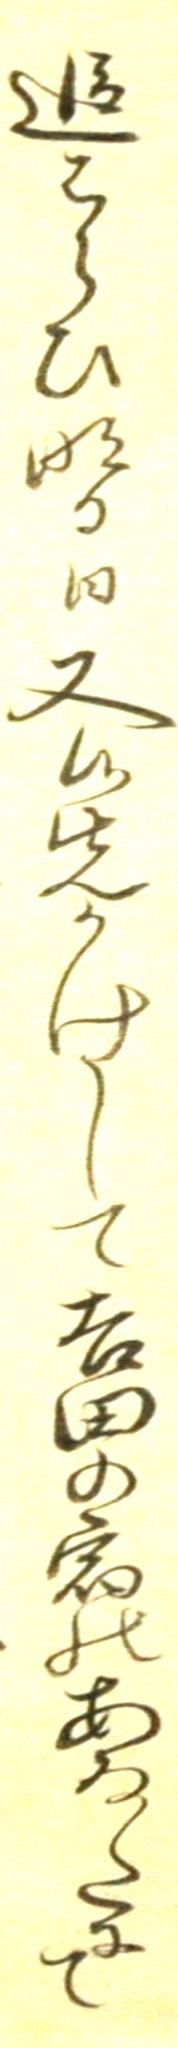追はらひ明る日又候先かけして吉田の宿のあなたにて

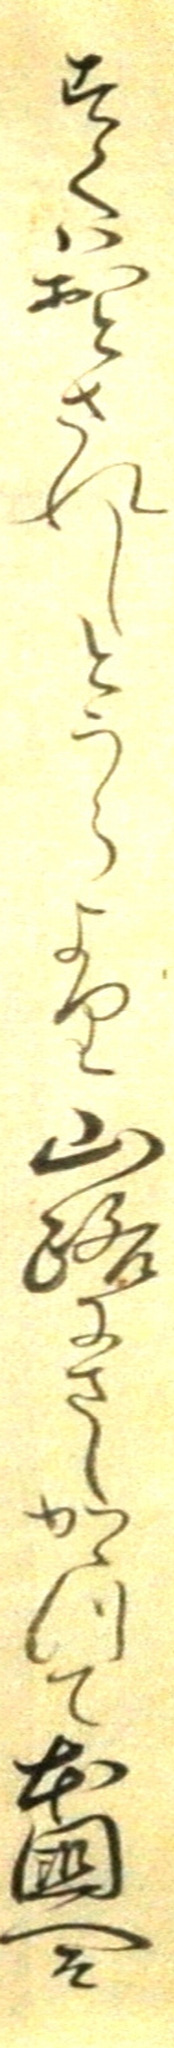すくはおとされしとうらより山路にさしかゝつて本国へそ
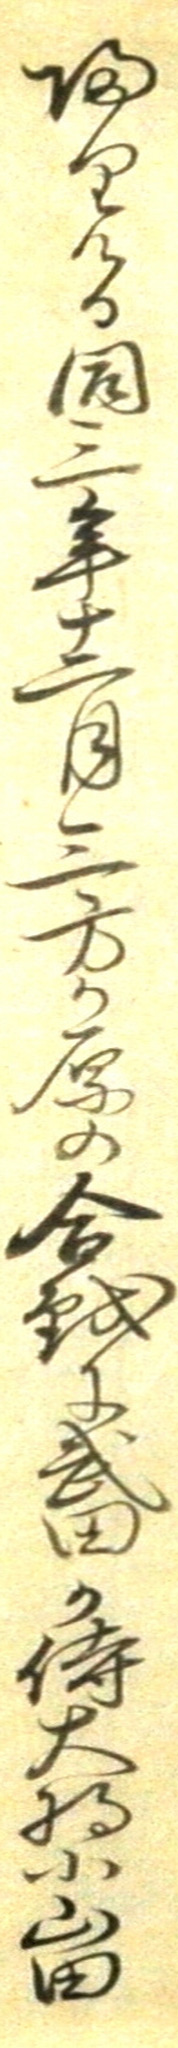帰りける同三年十二月三方か原の合戦に武田か侍大将小山田
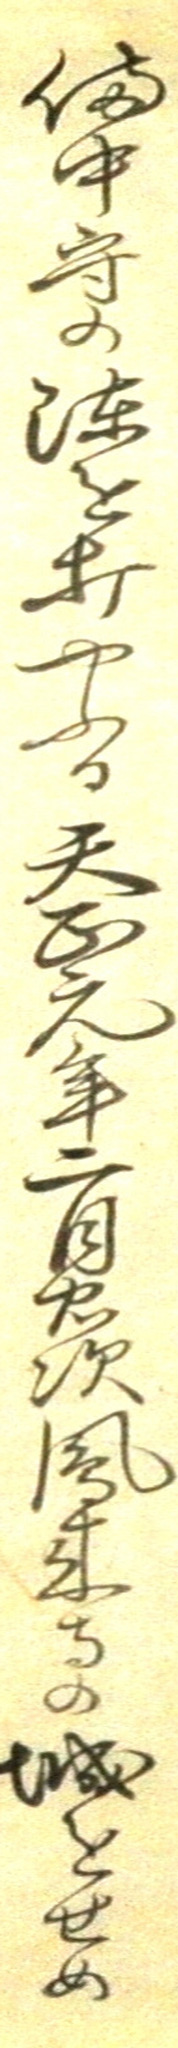備中守の陣を打やふる天正元年二月忠次鳳来寺の城をせめ
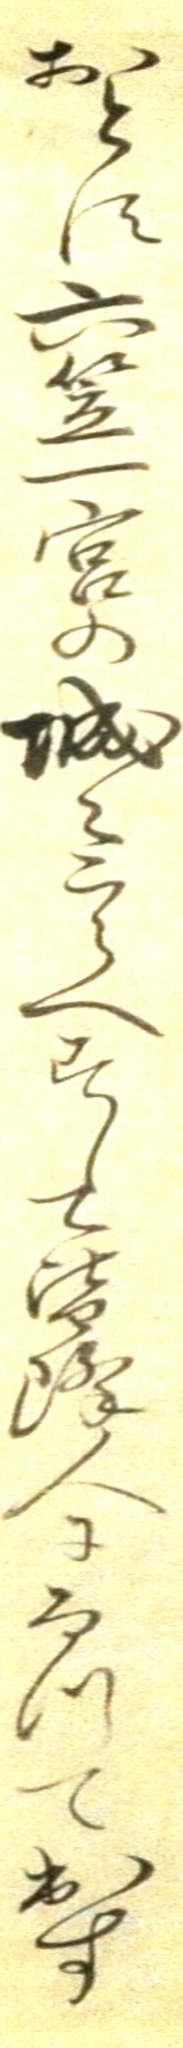おとす六笠一宮の城々こらへすして皆降人になつて出す
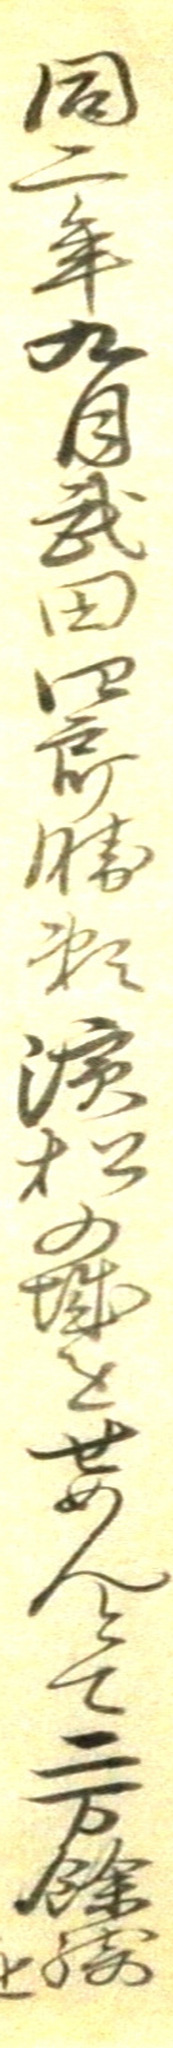同二年九月武田四郎勝頼浜松の城をせめんとて二万余騎を
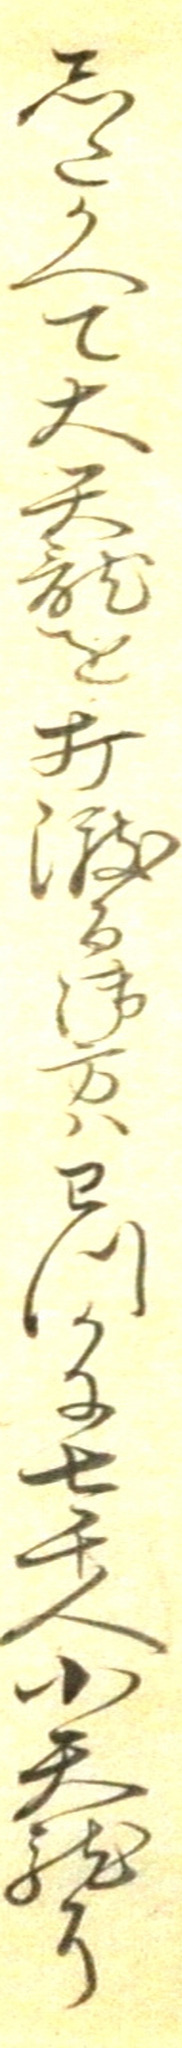したかへて大天竜を打渡る御方はわつかに七千人小天竜に
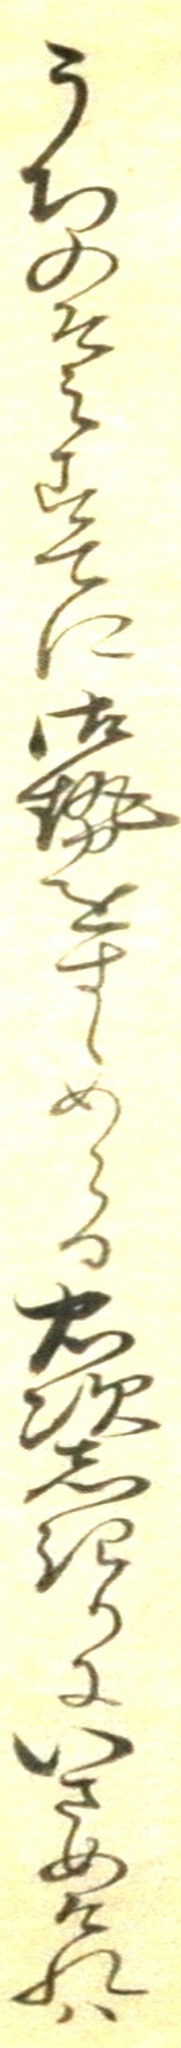うちのそみすてに御勢をすゝめらる忠次しきりにいさめけれは
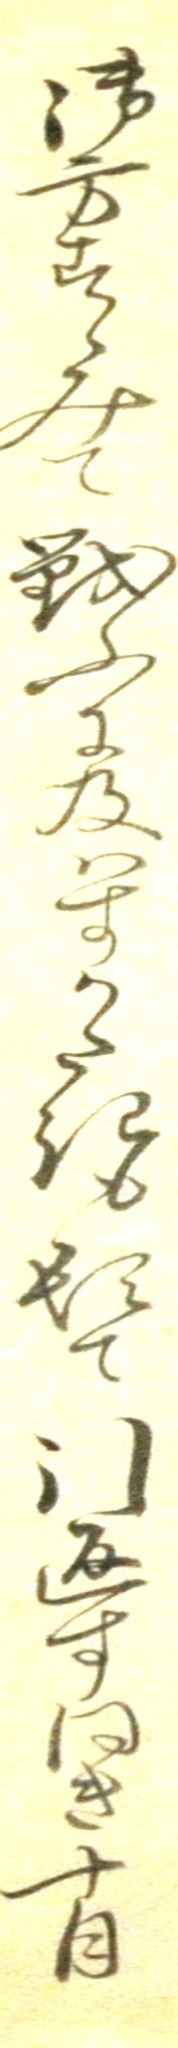御方すゝみて戦ふに及はすかたきも頓て引返す同き十月
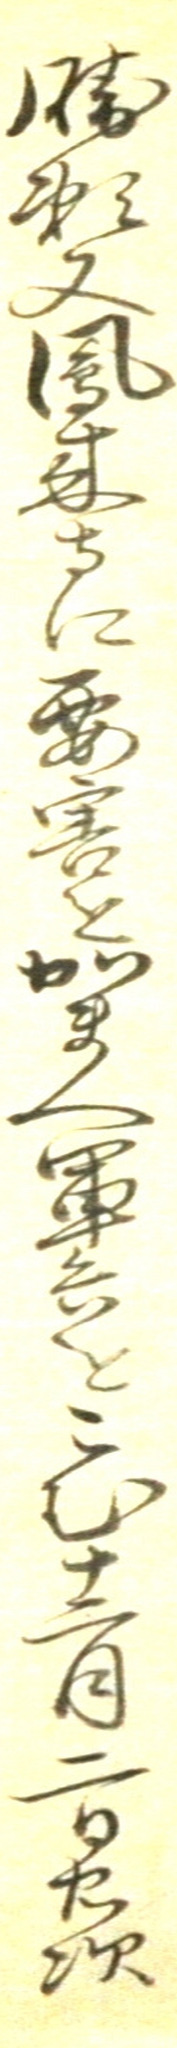勝頼又鳳来寺に要害をかまへ軍兵をこむ十二月二日忠次
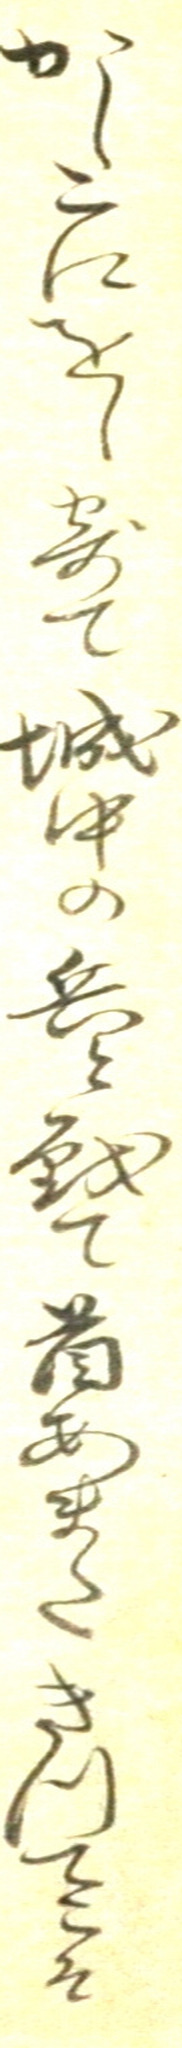かしこにをし寄て城中の兵と戦て首あまたきつてこそ
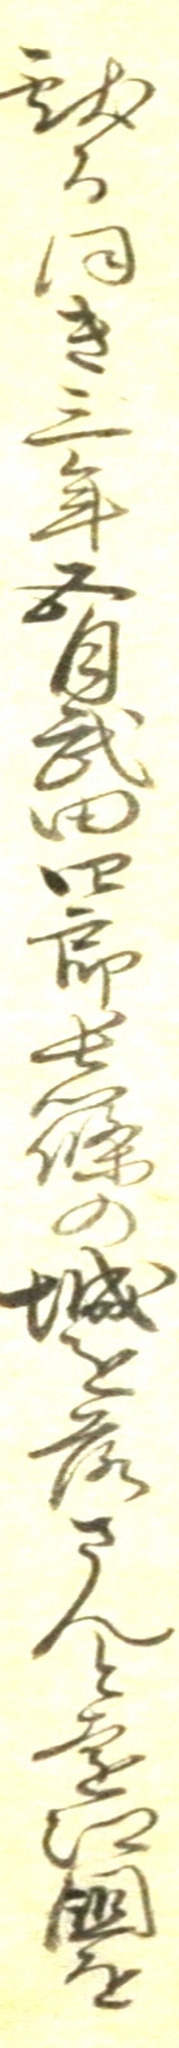献る同き三年五月武田四郎長篠の城を落さんと遠江国を
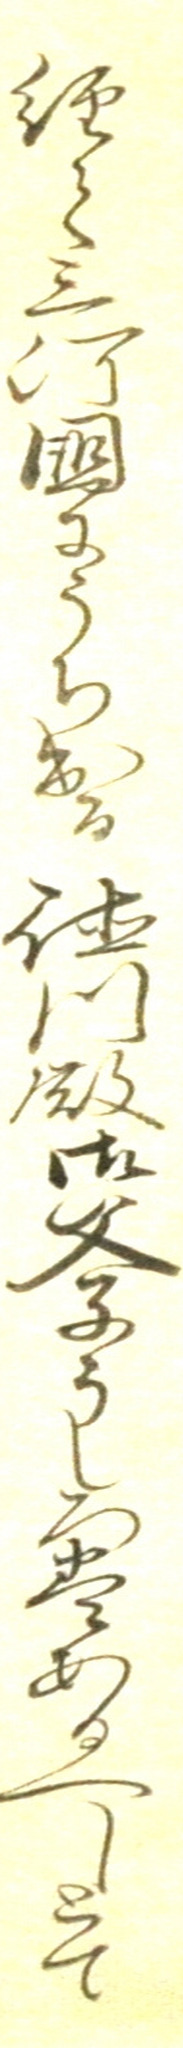経て三河国にうち出る徳川殿御父子うしろ巻あるへしとて
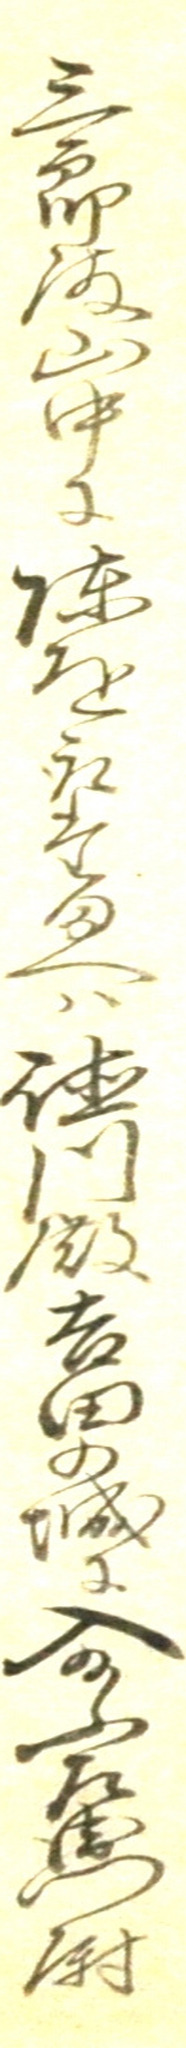三郎殿山中に陣を取たまへは徳川殿吉田の城に入給ふ左衛門尉
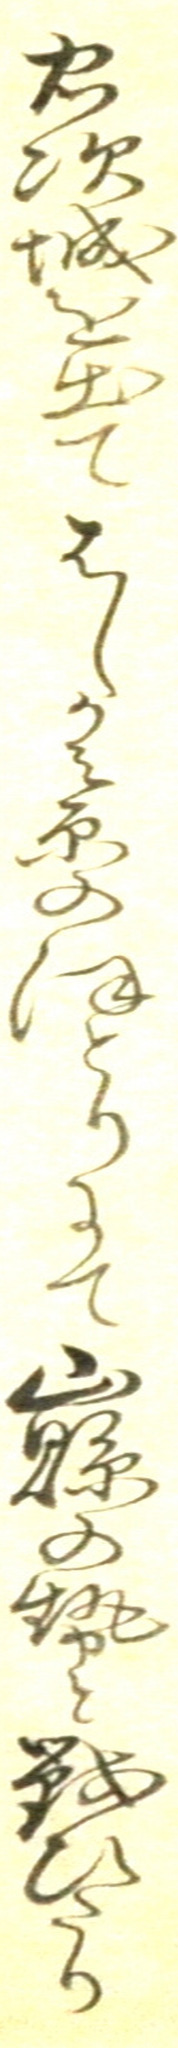忠次城を出てはしかみ原のほとりにて山縣の勢と戦ひたり
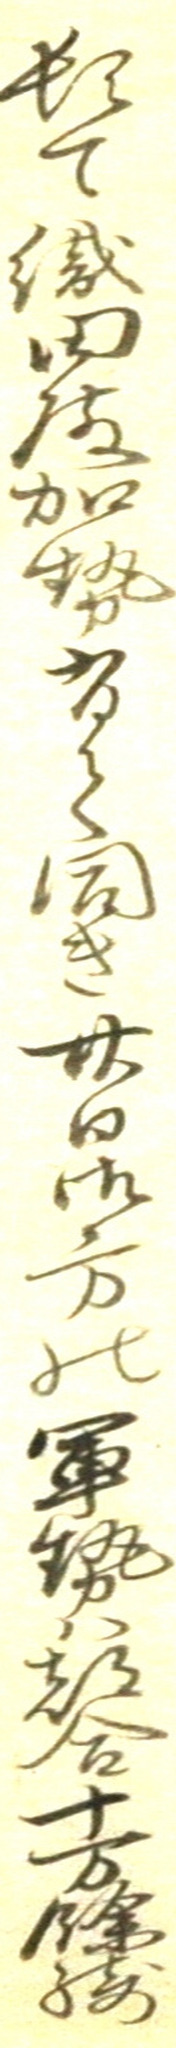頓て織田殿加勢有て同き廿日御方の軍勢は都合十万余騎
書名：藩翰譜（四・上）
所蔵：伊那市立高遠町図書館・合同会社AMANE
